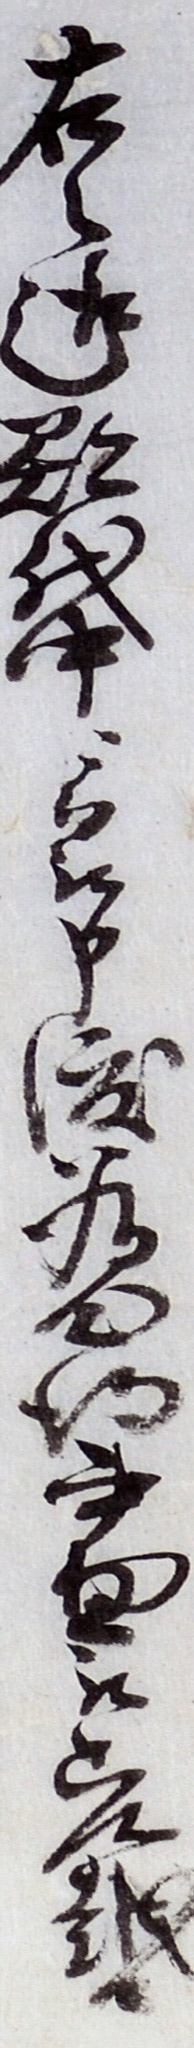右之趣郡代中ニ而被申渡為心得書面被差越候
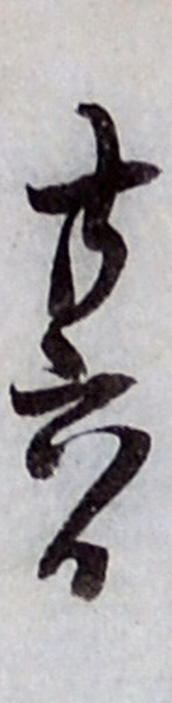廿六日
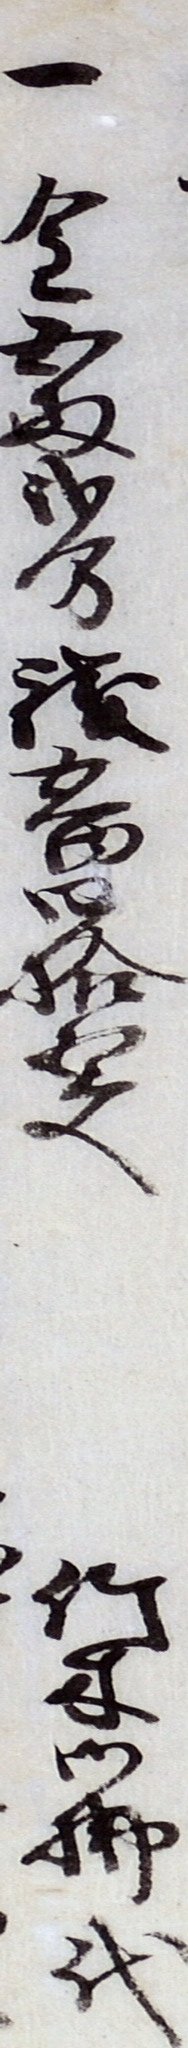一金五匁弐分銭五百四拾五文竹木御払代
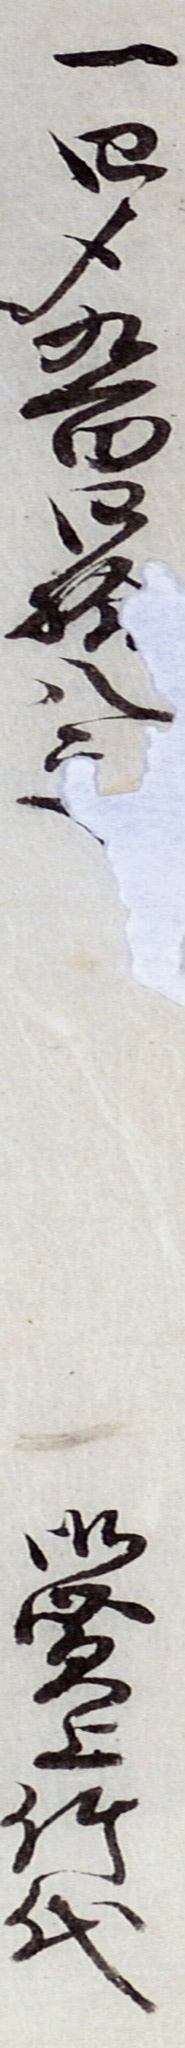一四貫九百四拾八文御買上竹代
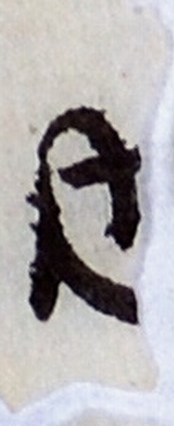廿六日
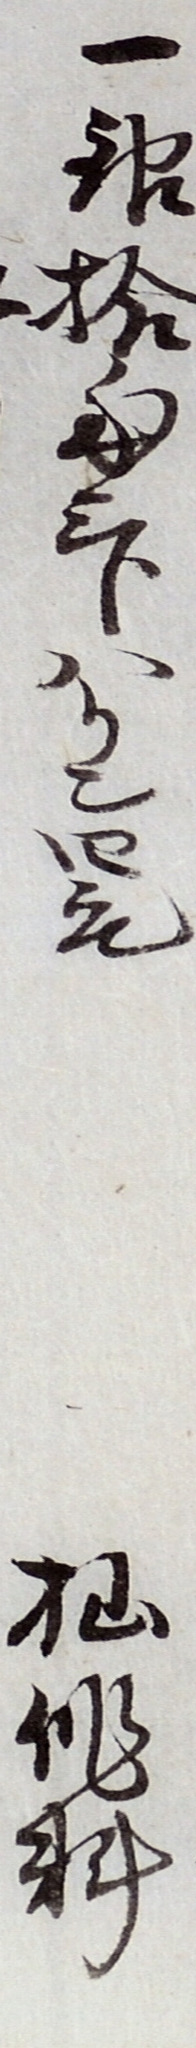一銀拾匁三分八りニ四毛杣作料
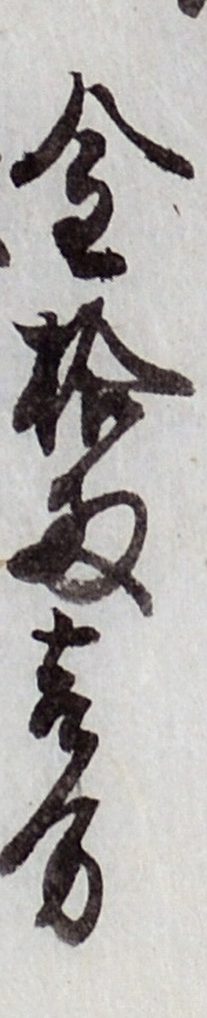金拾匁壱分
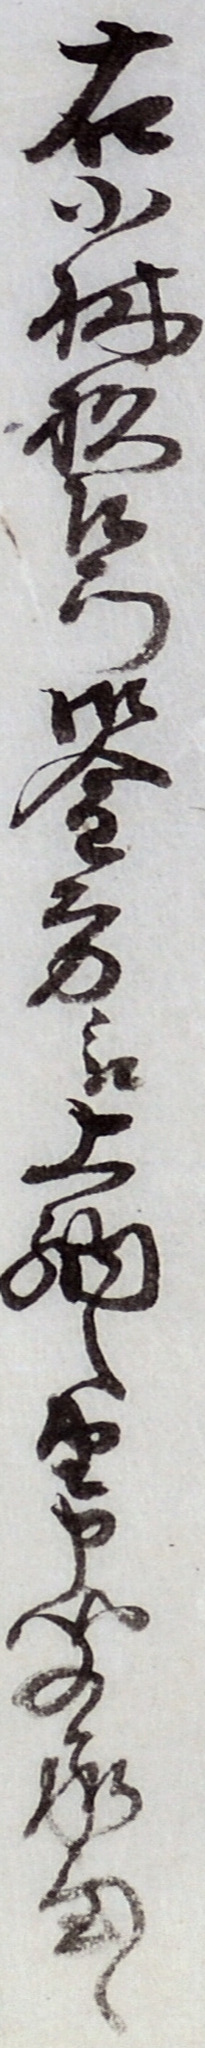右小林杦左衛門御金方江上納之由申聞承置候
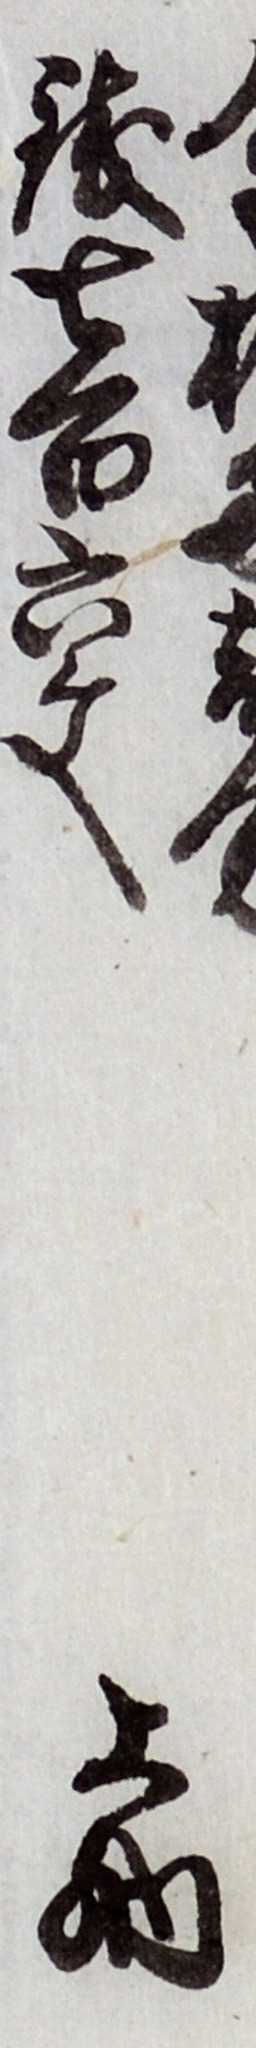銭七百六文上納
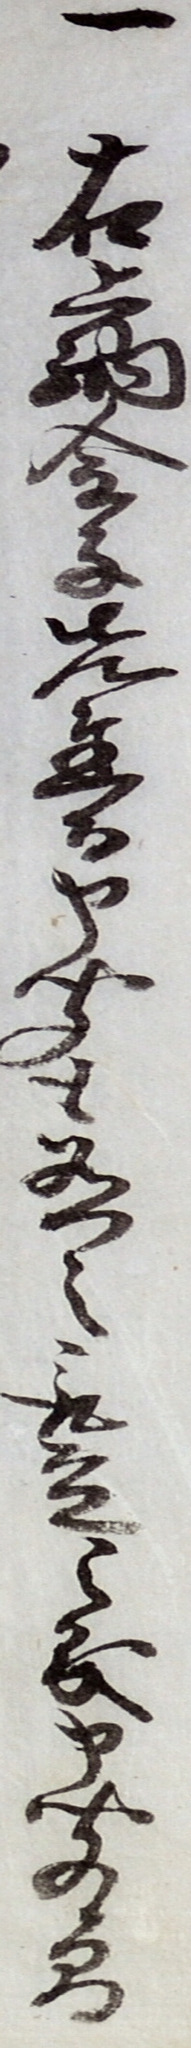一右上納金子先達而申聞も有之取立之義申聞候間
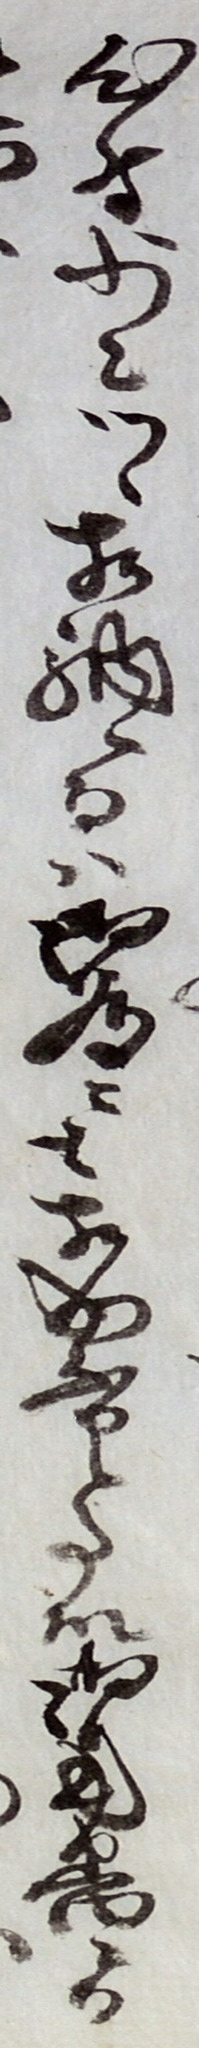心付け少々ツヽ相納候而ハ御為ニも相成不申候事故御用番ニ而
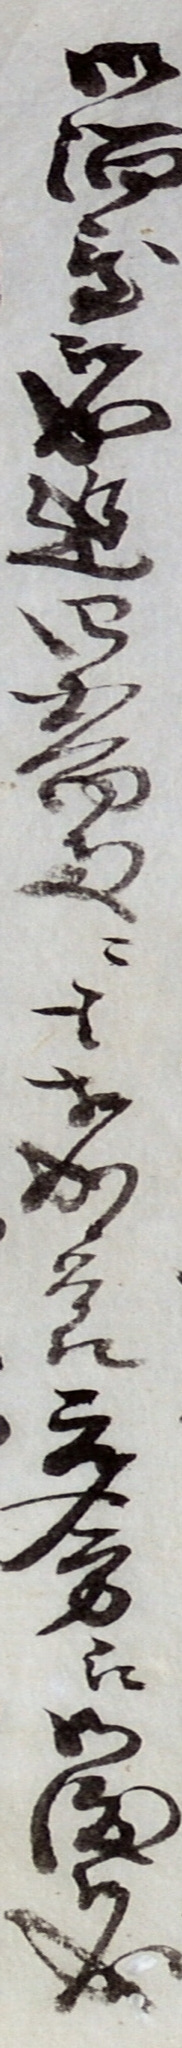御溜置被成追四五百匁ニも相成候節元〆方江御渡被成
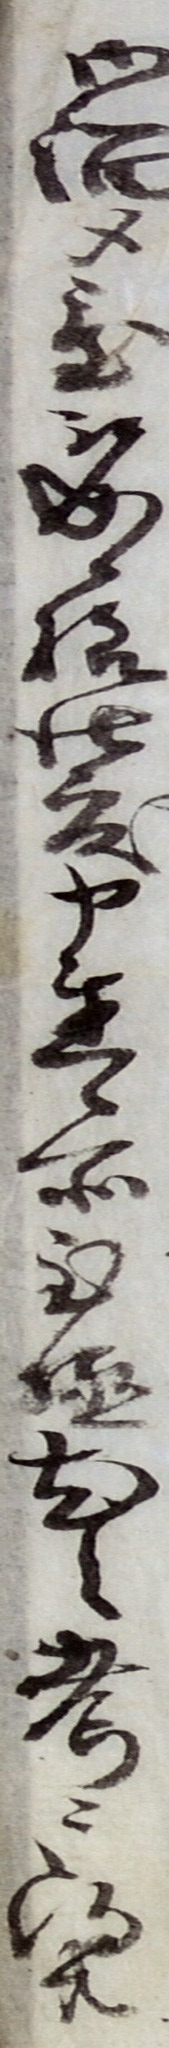御溜メ置被成候様此度申達候所至極尤之考ニ候得共
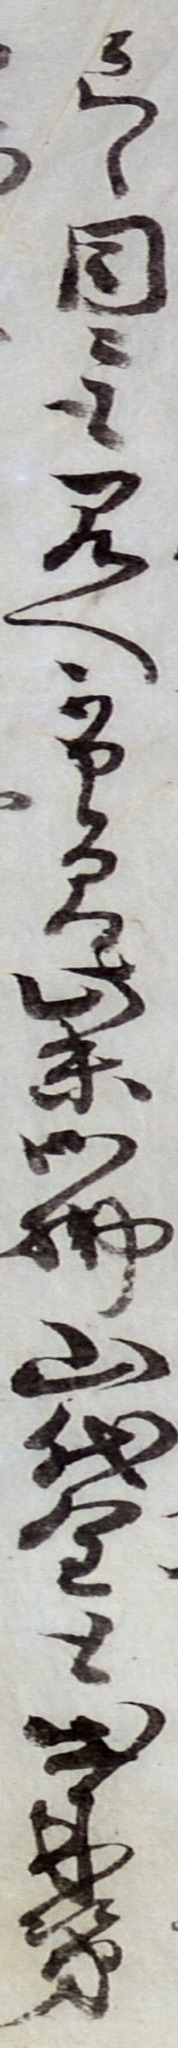候ハヽ目ニも見へ可申候間此末御払山代金も出来次第

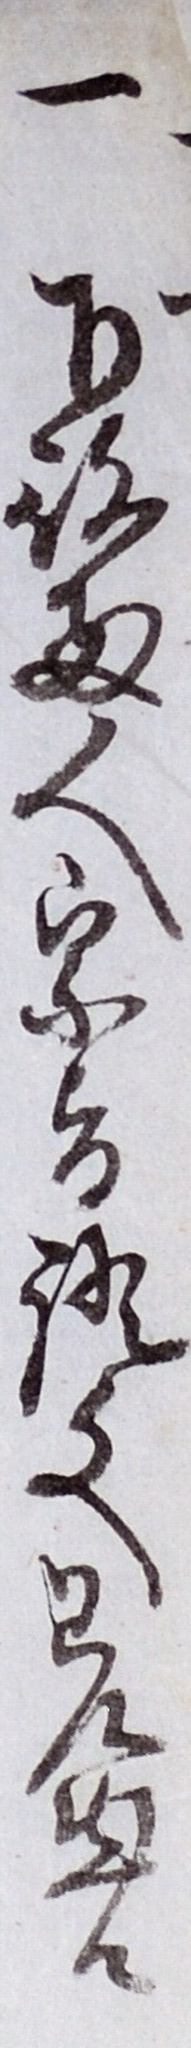一下役両人宗旨証文差出候
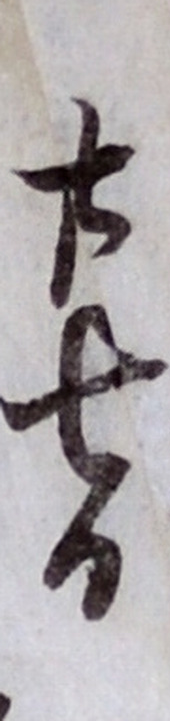廿七日
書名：御山奉行御用留
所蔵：伊那市立高遠町図書館・合同会社AMANE
